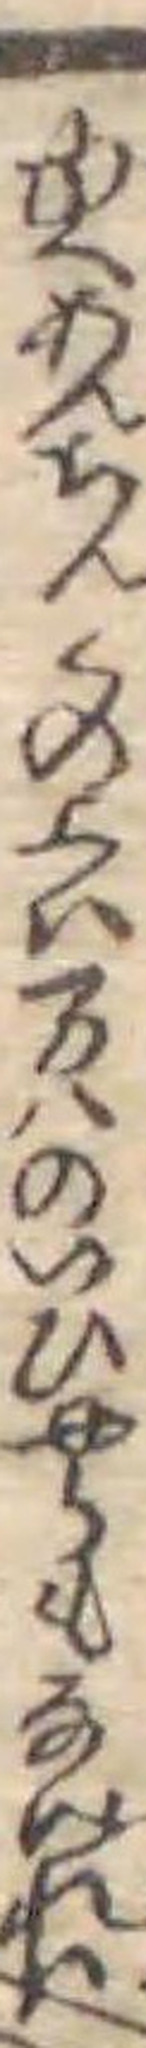ゆへあんちんかの上は万八のいひやうもなけれは
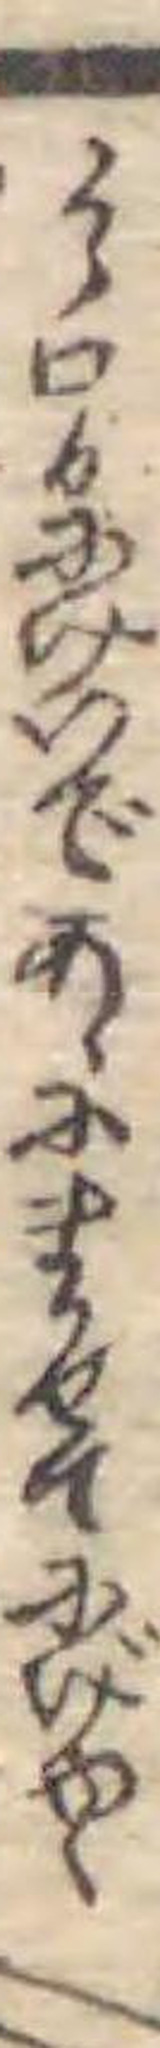うら口よりにけいであしにまかせてにげゆく
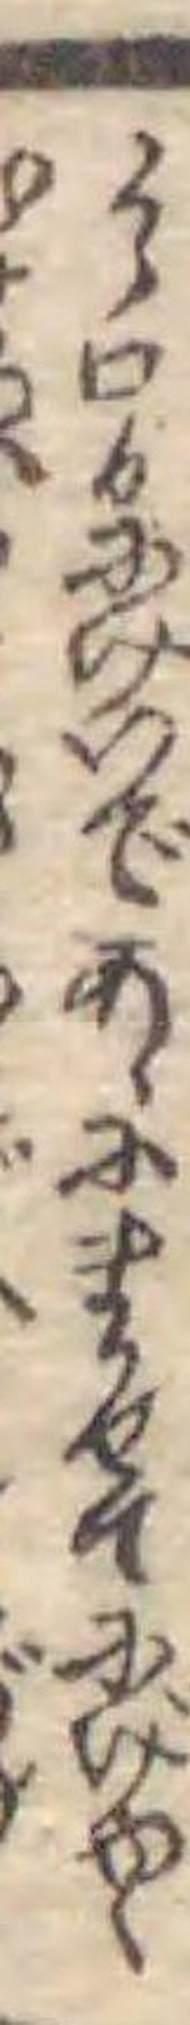うら口よりにけいであしにまかせてにげゆく
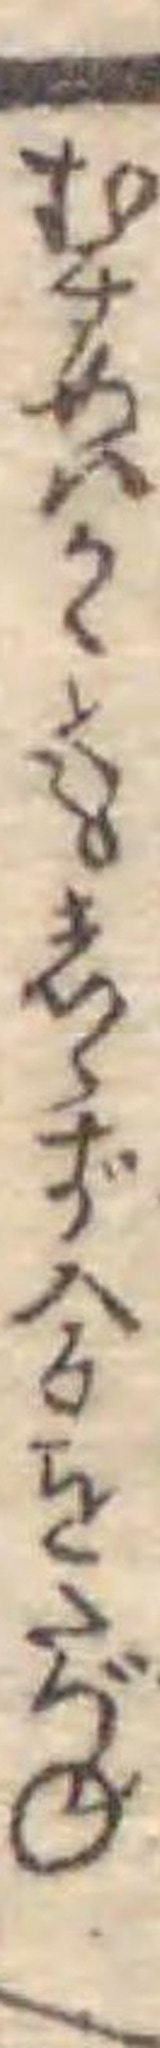むすめはかくともしらず金をたづね
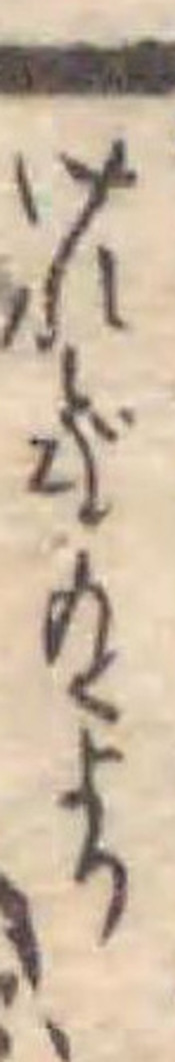けれどももとより
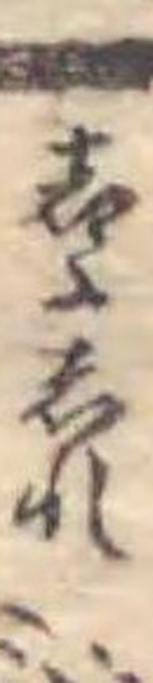しよしれ
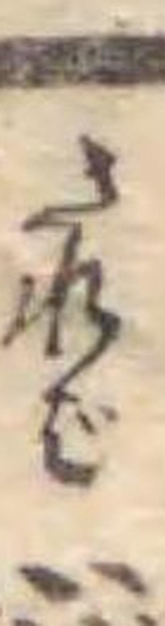されば
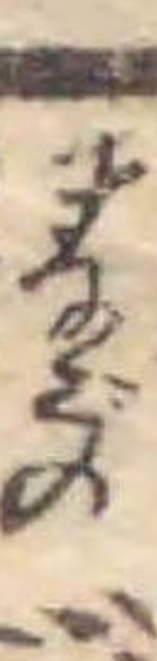まなごの
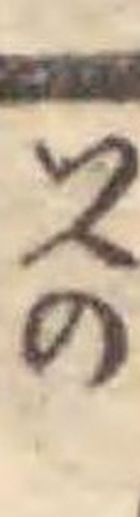いへの
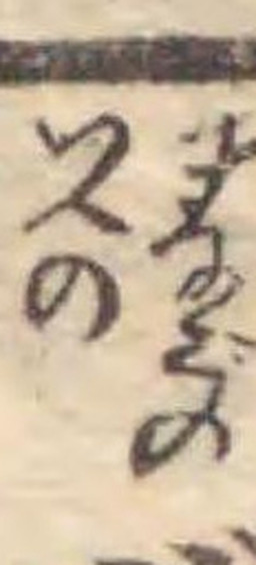いへの
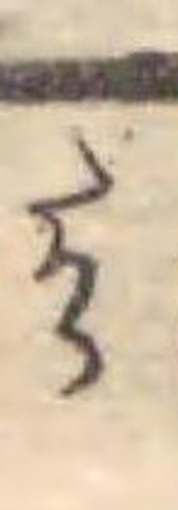たから
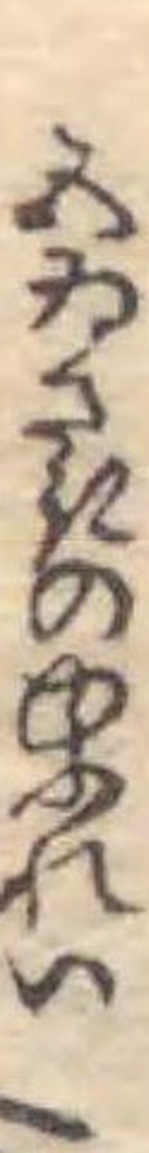五ゐさきのゆふれい
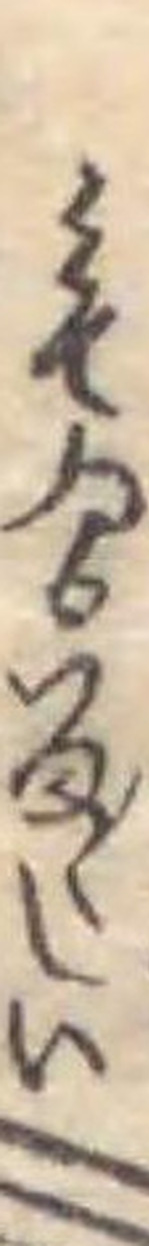みてゐるいま〳〵しい
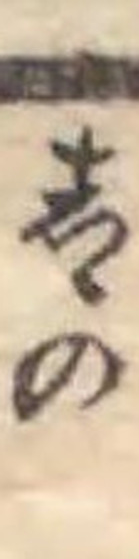しゝの
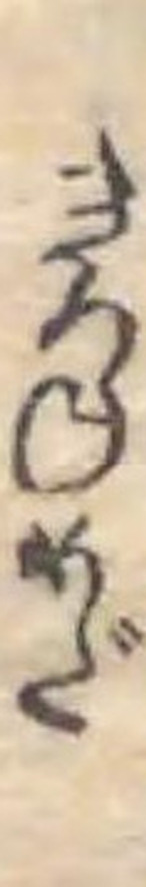きつねめだ
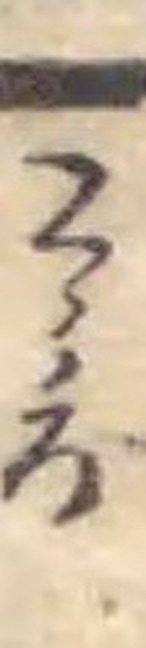こうろ
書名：鐘入七人化粧 : 3巻
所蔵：国立国会図書館 National Diet Library, JAPAN
